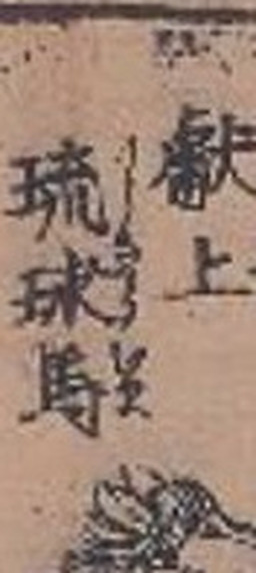琉球馬
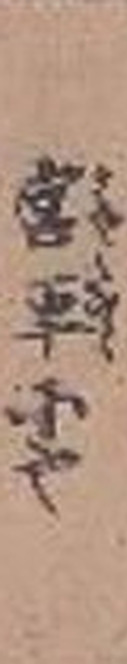宮平にや
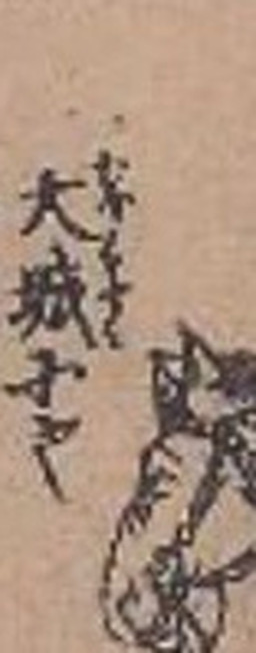大城にや
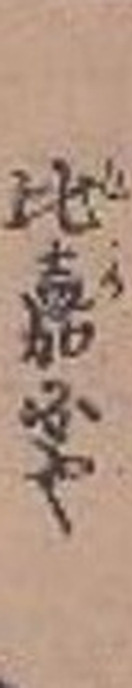比嘉にや
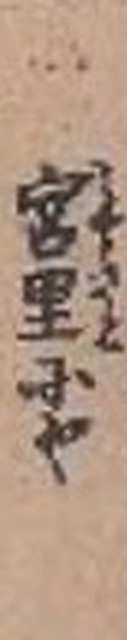宮里にや
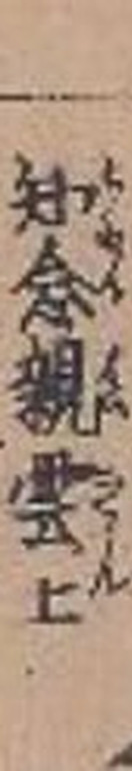知念親雲上
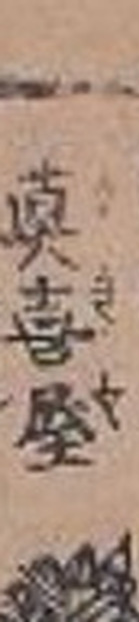真喜屋
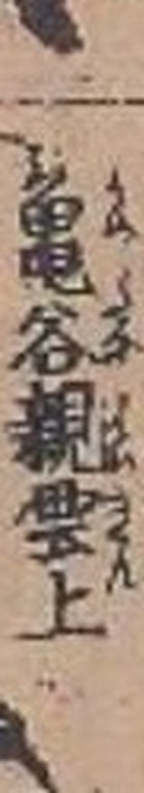亀谷親雲上
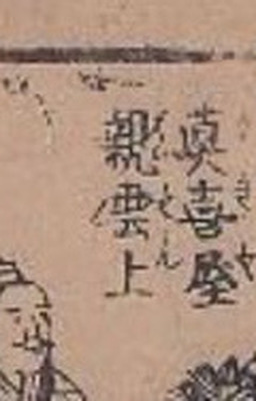親雲上
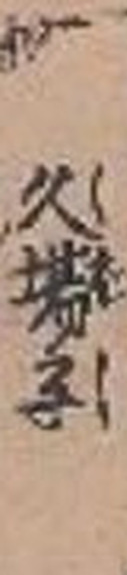久場子
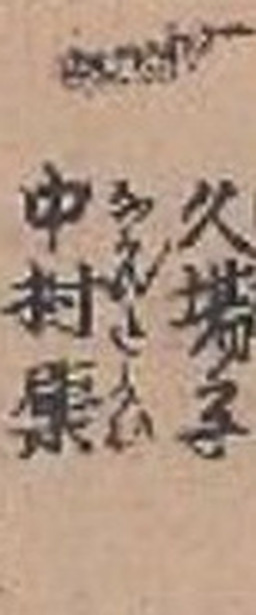中村渠
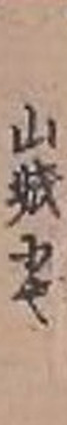山城にや
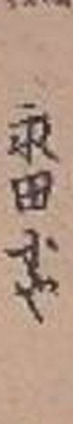永田にや
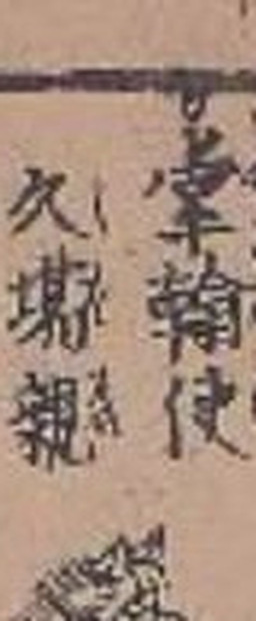久場親
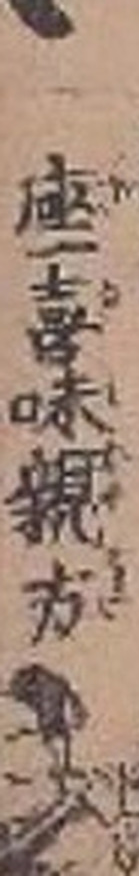座喜味親方
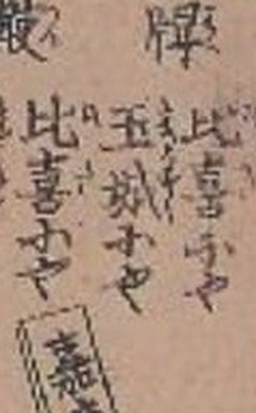山城にや
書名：琉球人行列附 天保十三壬寅年十一月
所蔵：University of the Ryukyus Library
